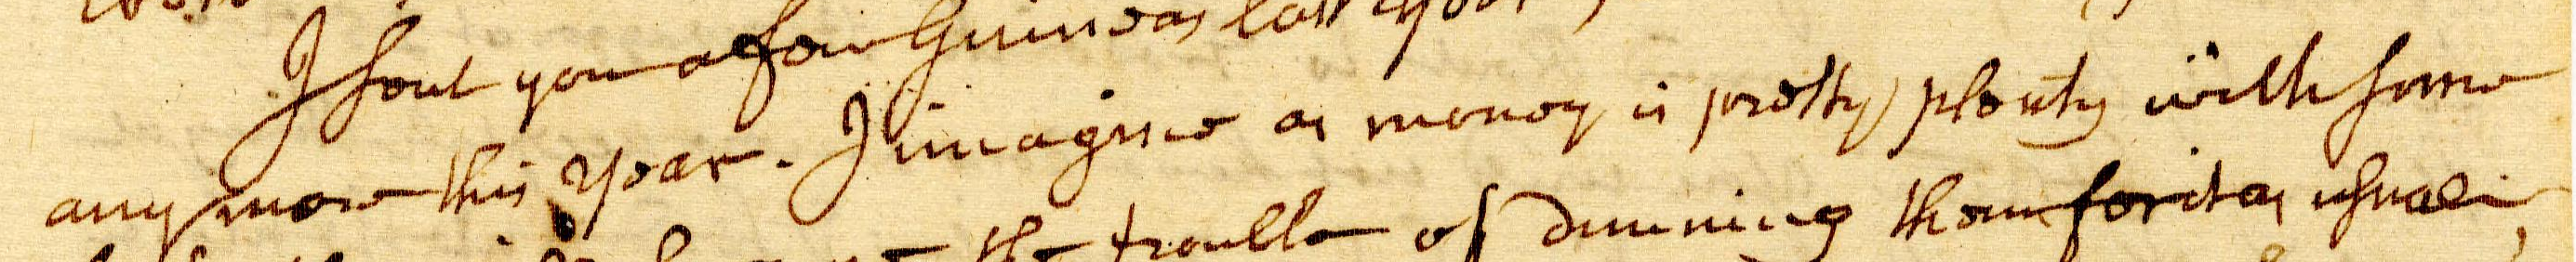any more this Year. I imagine as money is pretty plenty with some
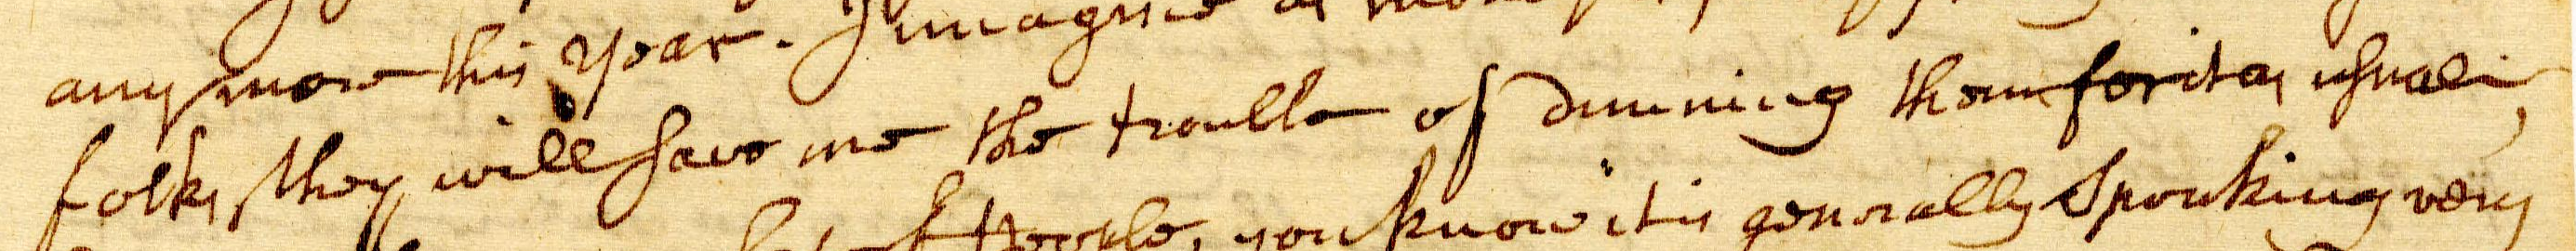folks, they will save me the trouble of of dunning them for it as usual,
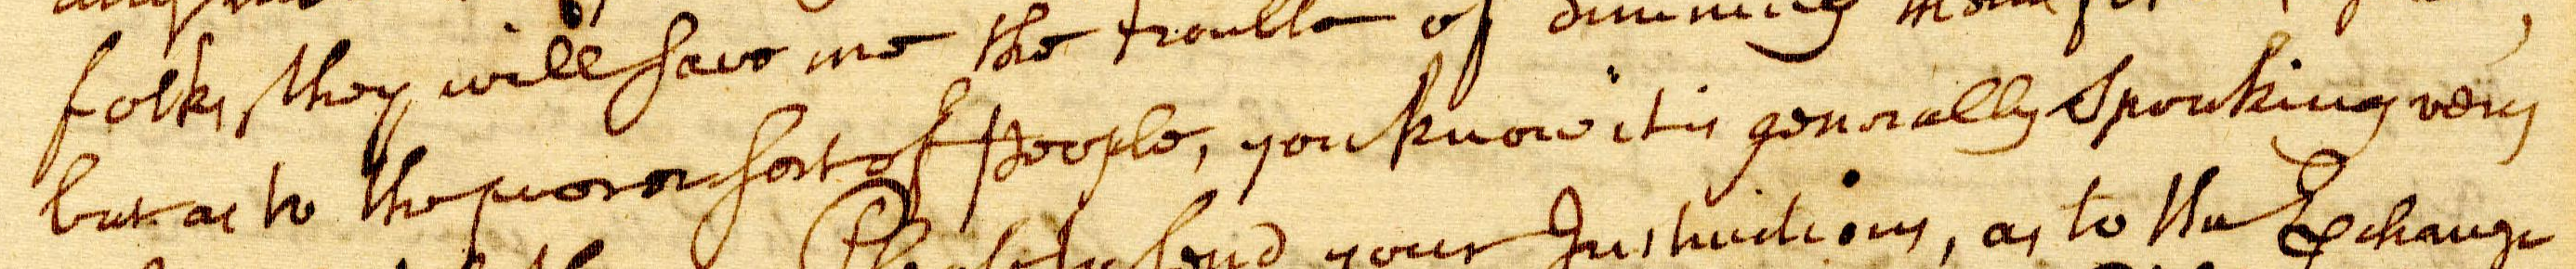but as to the poorer sort of people, you know it is generally Speaking very
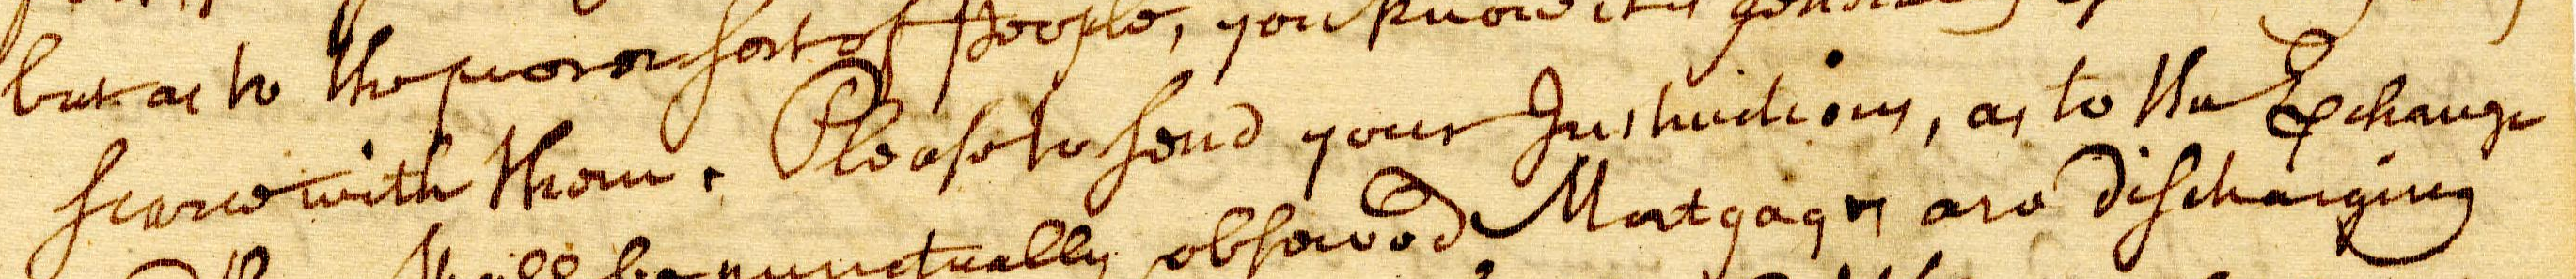scarce with them. Please to send your Instructions, as to the Exchange
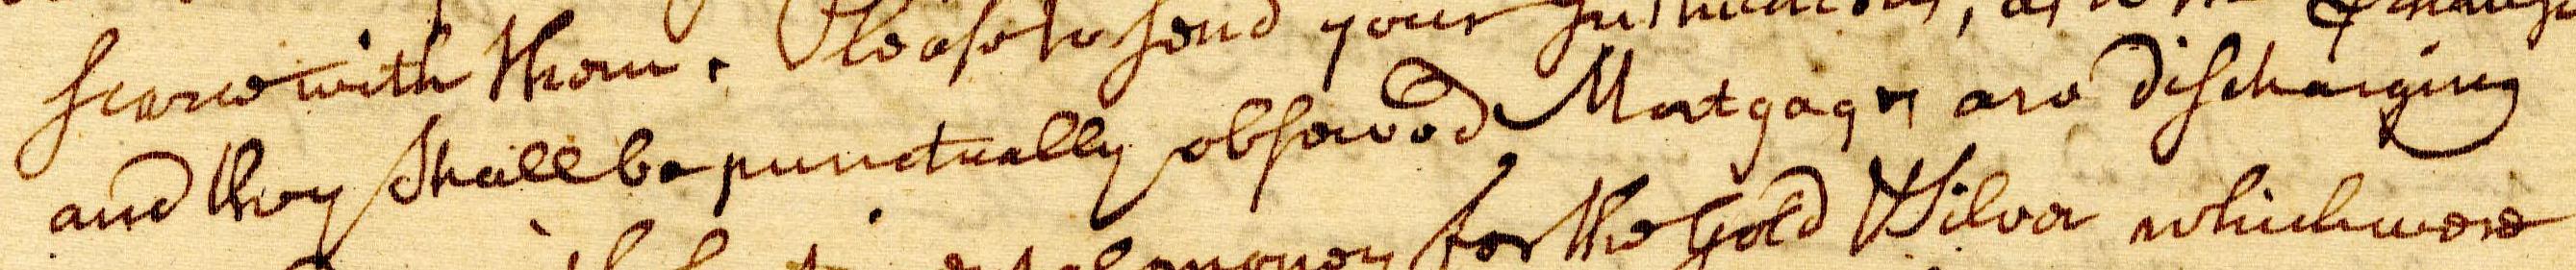and they shall be punctually observed Mortgages are discharging
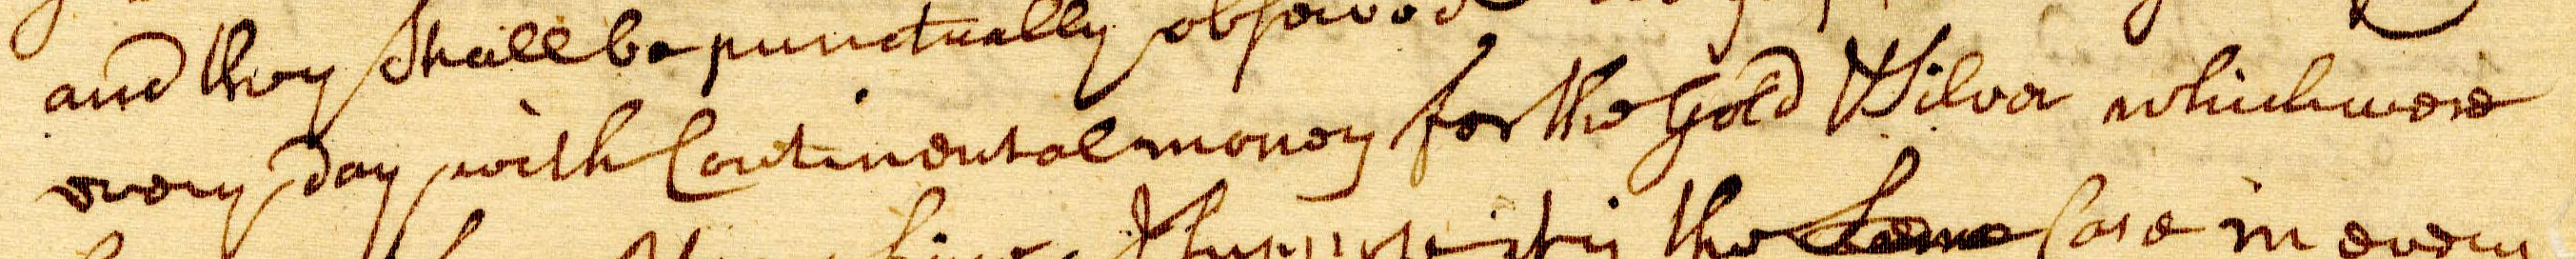every day with Continental money for the Gold & Silver which were
